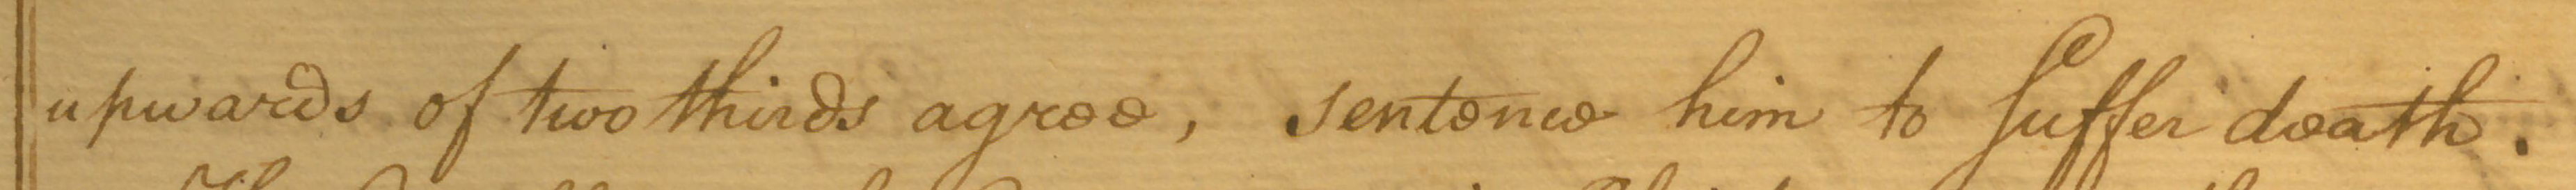upwards of two thirds agree, sentence him to suffer death.
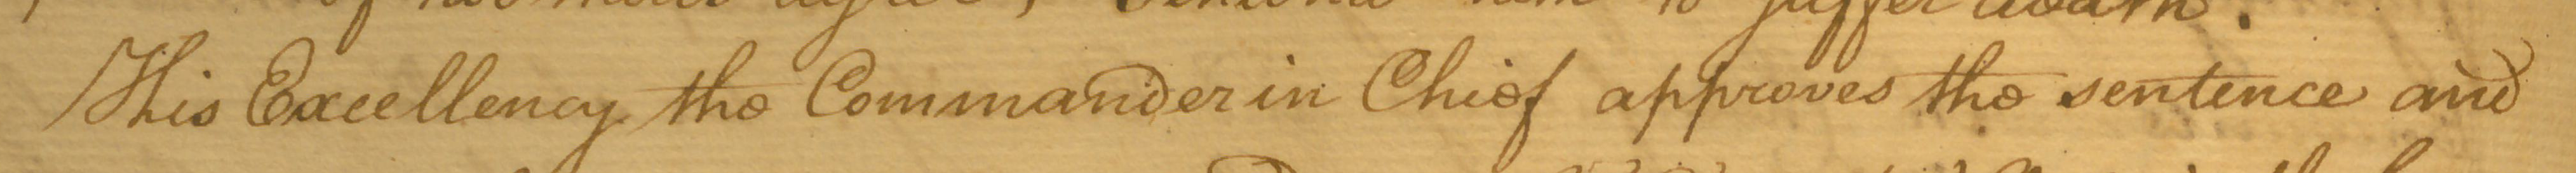His Excellency the Commander in Chief approves the sentence and
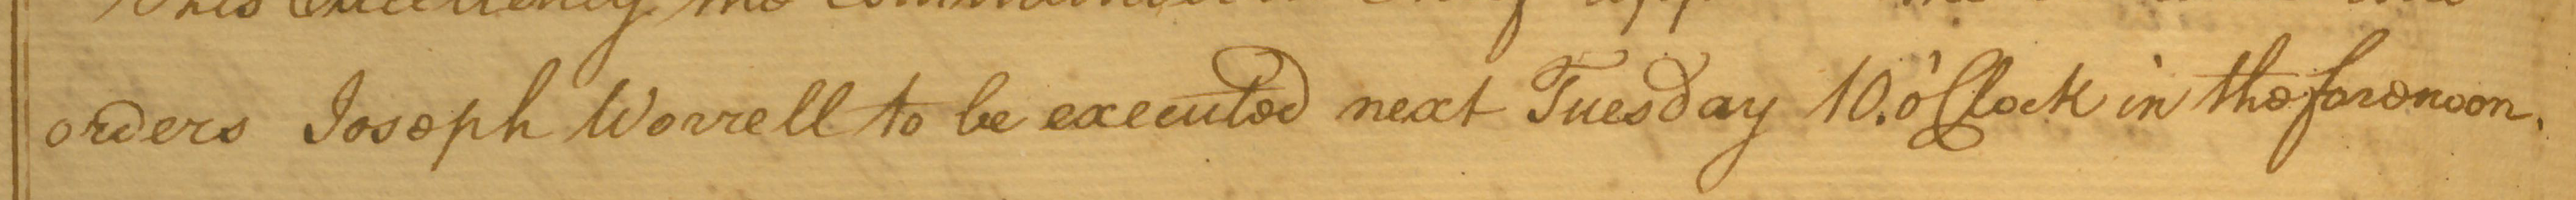orders Joseph Worrell to be executed next Tuesday 10. o'Clock in the forenoon.
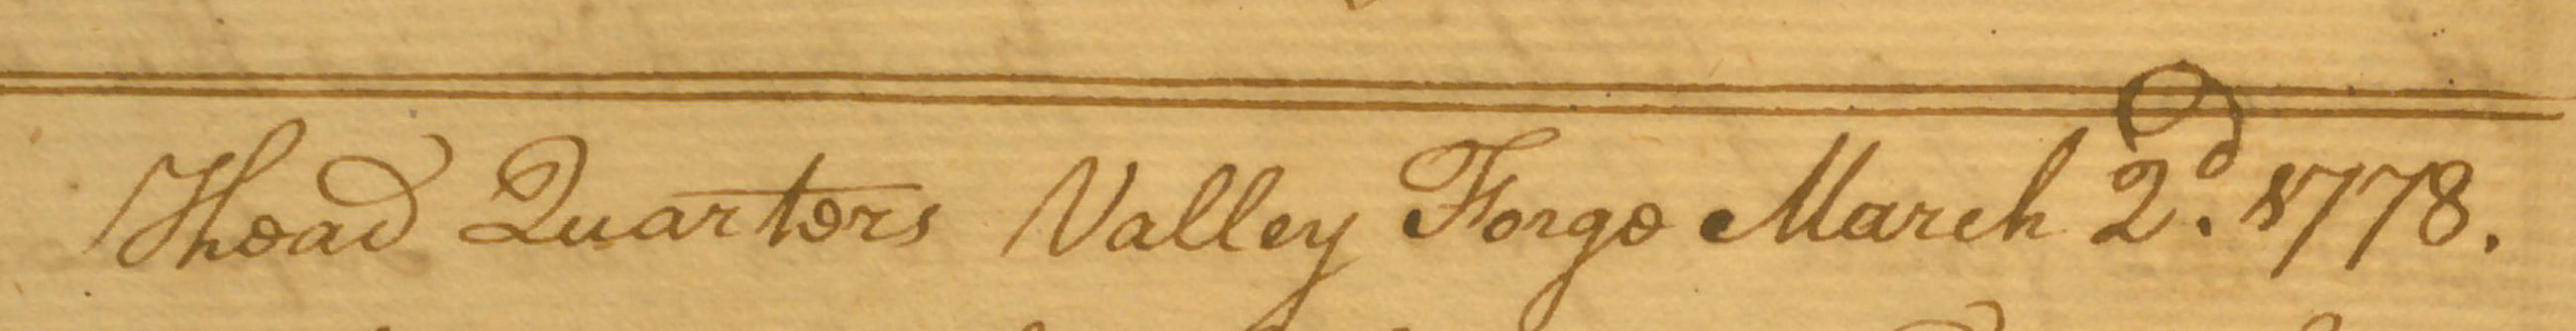Head Quarters Valley Forge March 2^d. 1778.
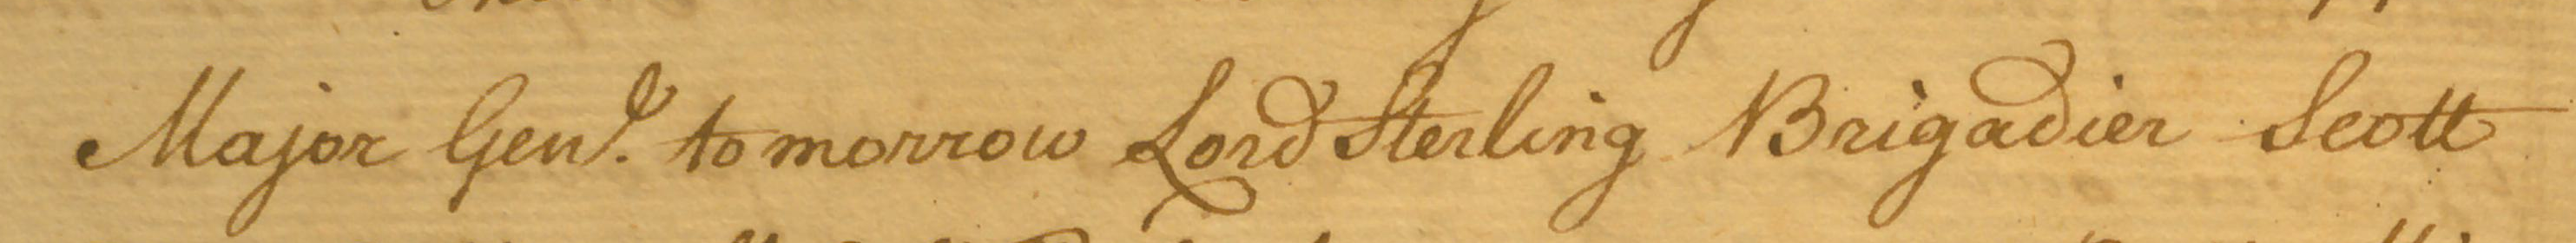Major Gen^l. tomorrow Lord Sterling Brigadier Scott
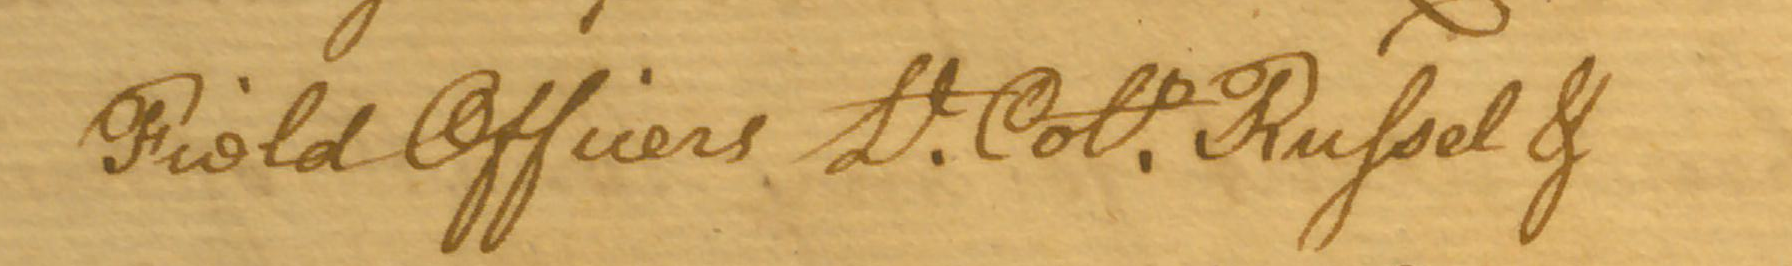Field Officers L^t. Col^o. Russel &
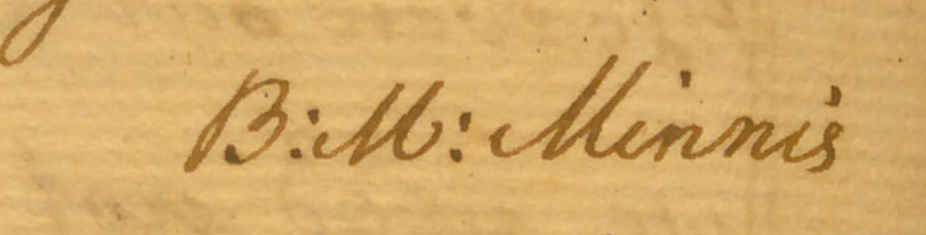B: M: Minnis
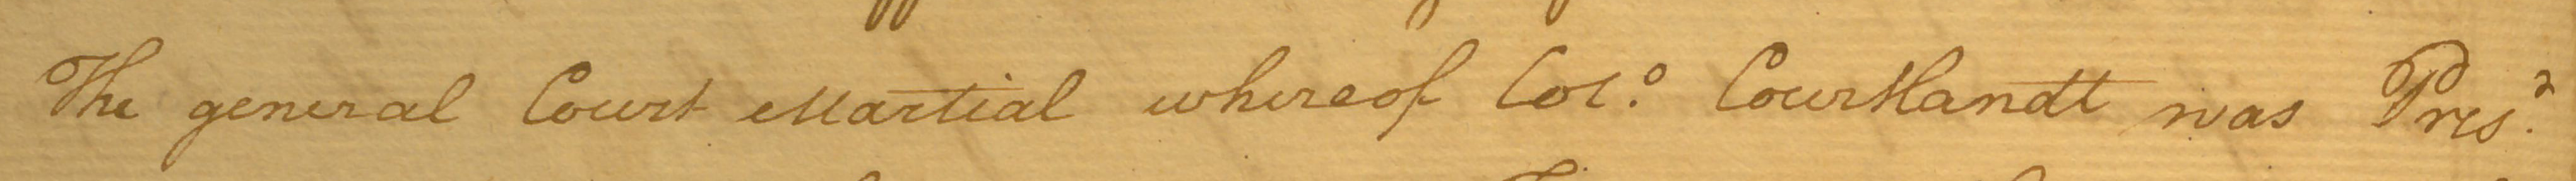The general Court Martial whereof Col^o. Courtlandt was Pres^t.
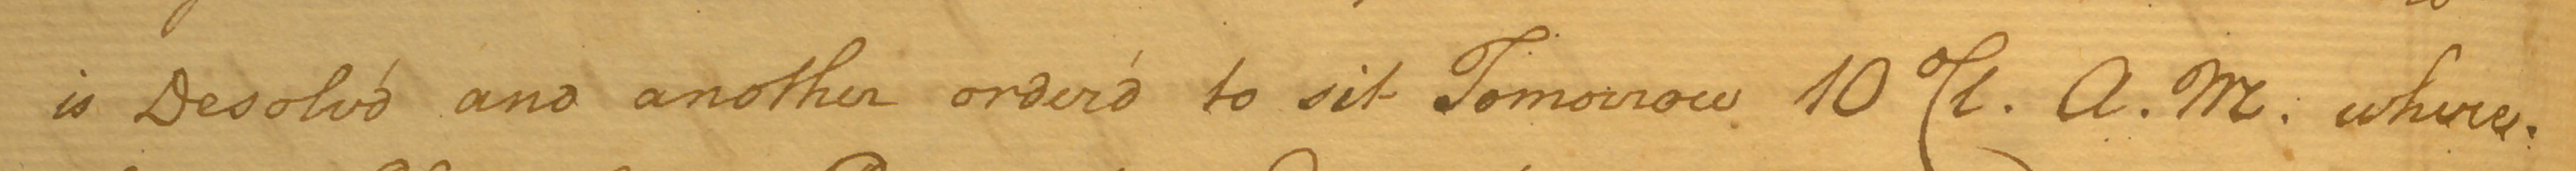is Desolv'd and another order'd to sit Tomorrow 10 ^oCl. A. M. where.
